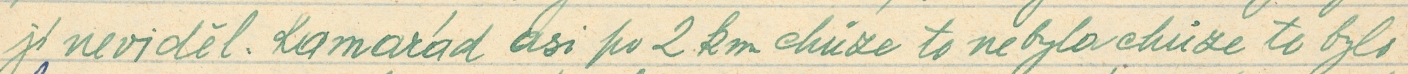jí neviděl. Kamarád asi po 2 km chůze to nebyla chůze to bylo
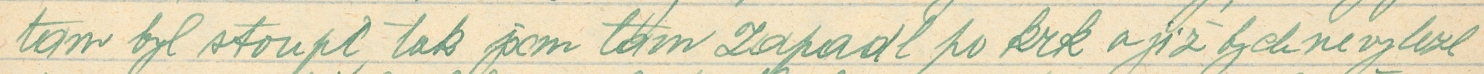tam byl stoupl, tak jsem tam zapadl po krk a již bych nevylezl
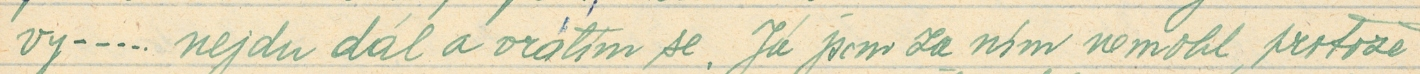vy----. nejdu dál a vrátím se. Já jsem za ním nemohl, protože
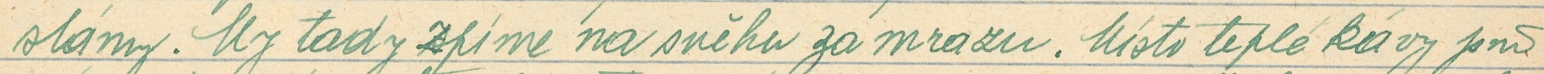slámy. My tady zpíme na sněhu za mrazu. Místo teplé kávy jsme
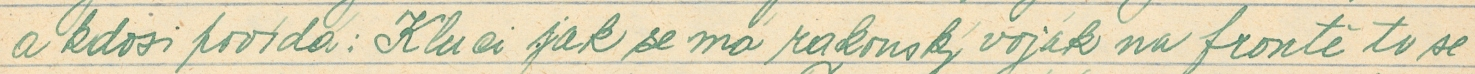a kdosi povídá: Kluci jak se má rakouský voják na frontě to se
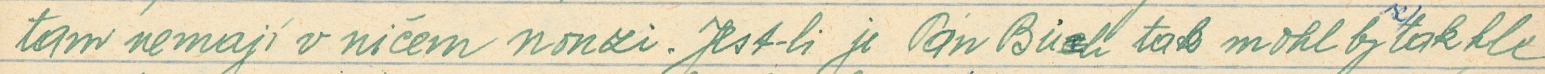tam nemají v ničem nouzi. Jest-li je Pán Bůch tak mohl by se takhle
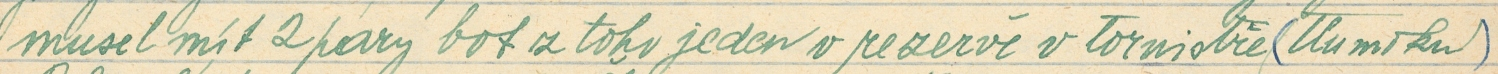musel mít 2 páry bot z toho jeden v rezervě v tornistře (tlumoku)
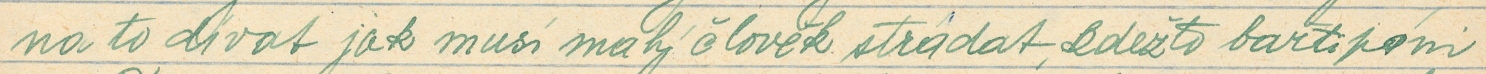na to dívat jak musí malý člověk strádat, kdežto bařtipáni
